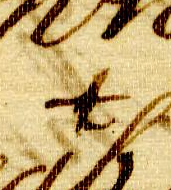t
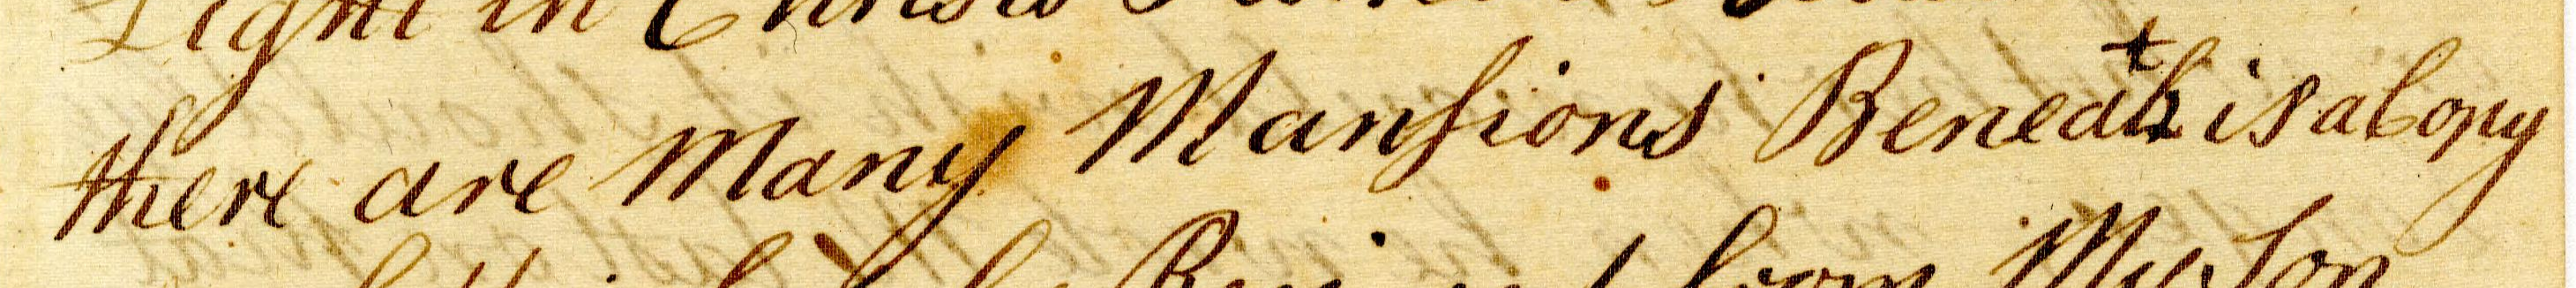there are Many Mansions Beneah is a Copy
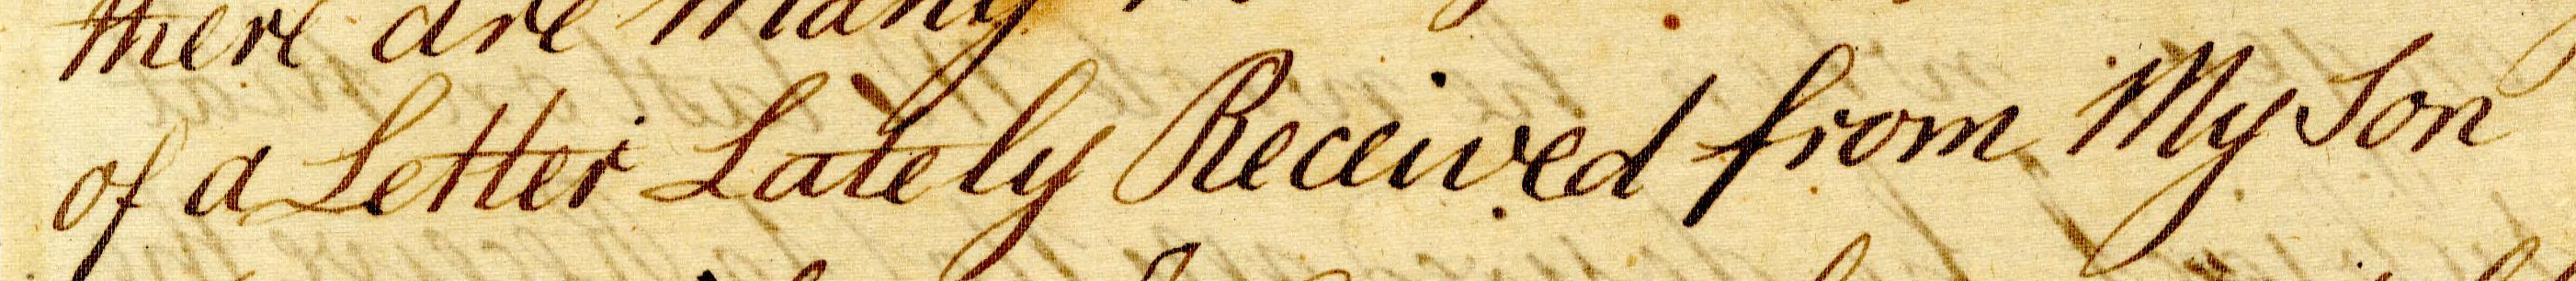of a Letter Lately Received from My Son
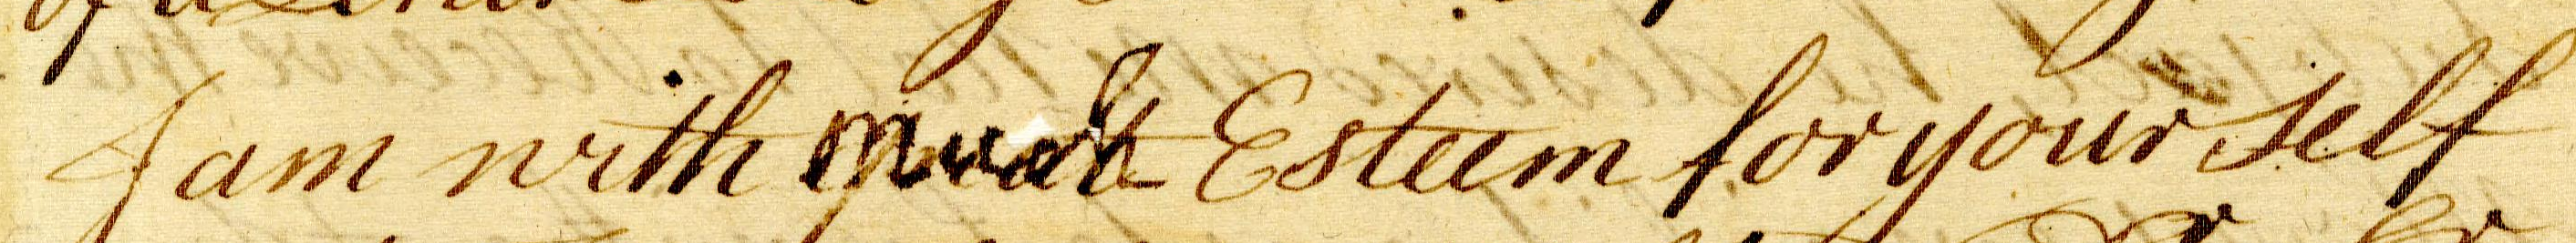I am with [Much] Esteem for your self
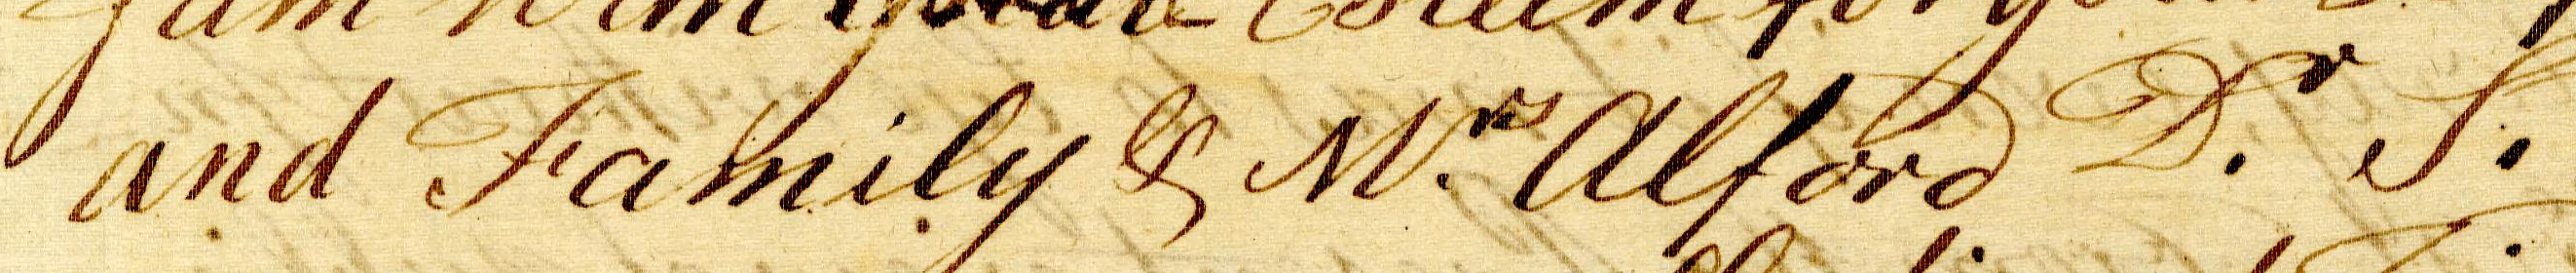and Family & M^rs. Alford D^r. S.
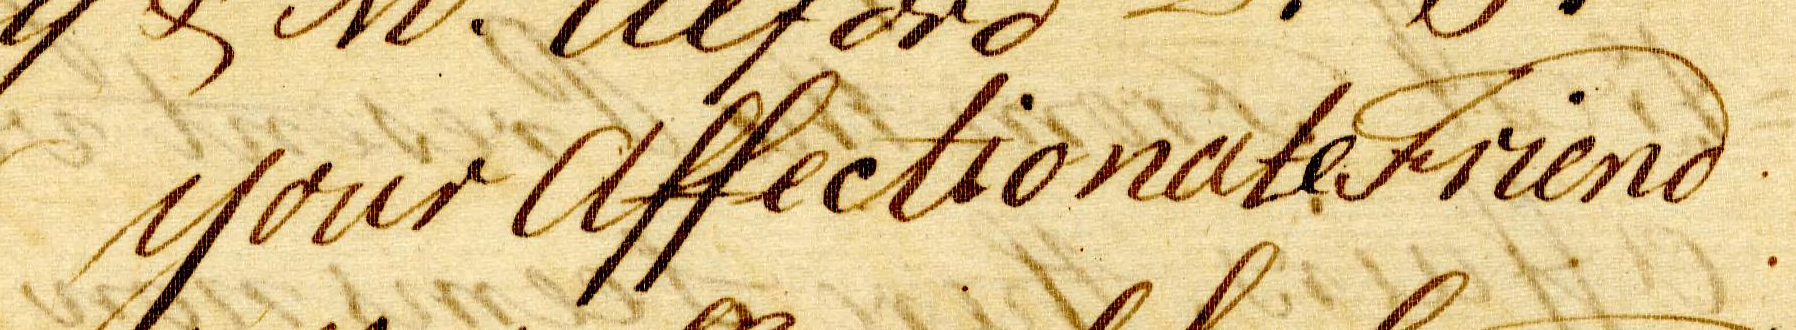your Affectionate Friend
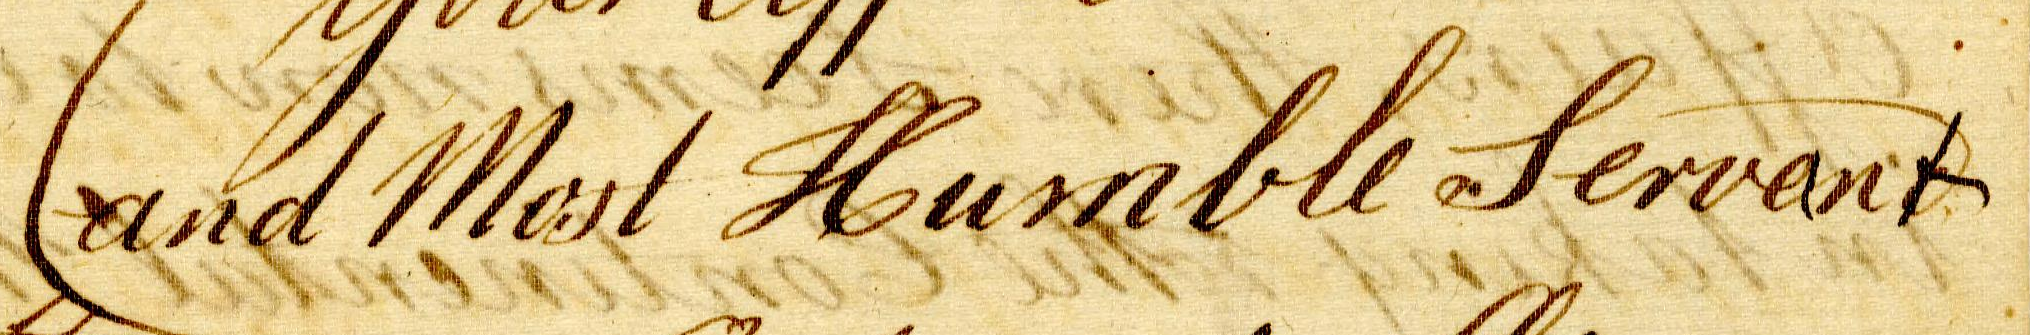and Most Humble Servant
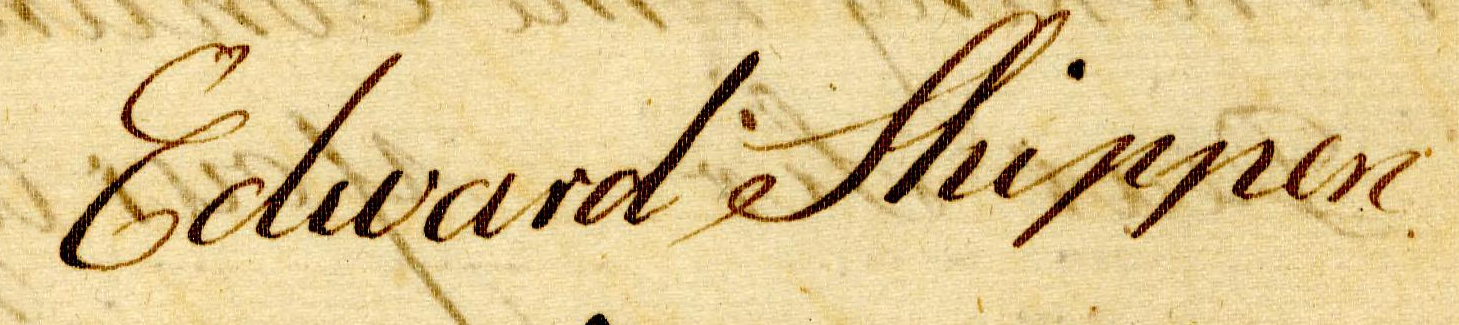Edward Shippen
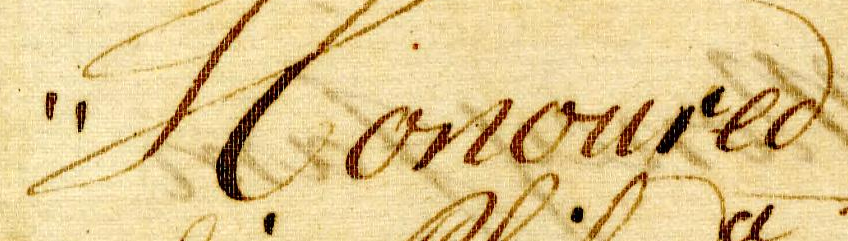Honoured
